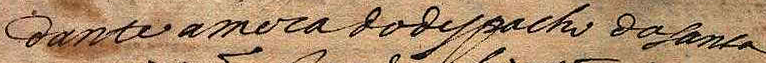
dante a meza do despacho da santa
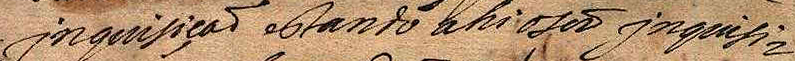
jnquisição estando ahi o so̅r jnquisi
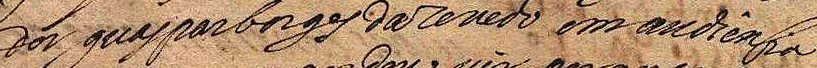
dor guaspar borges dazeuedo em audiênCia
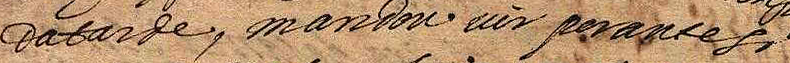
da tarde, mandou uir perante si
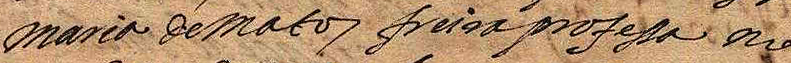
maria de matos freira professa no
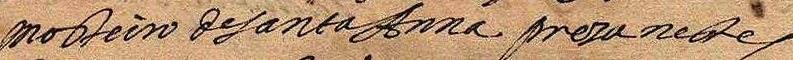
mosteiro de santa Anna preza nestes
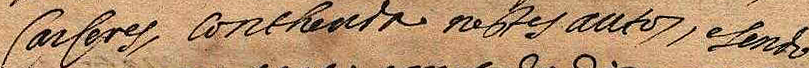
CarCeres, contheuda nestes autos, e sendo
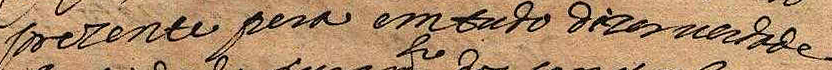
prezente pera em tudo dizer uerdade
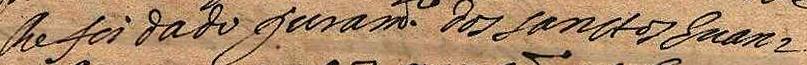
lhe foi dado juram.to dos sanctos Euan
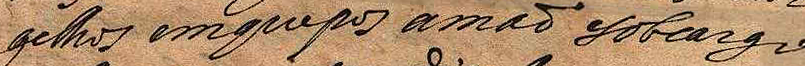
gelhos em que pos a maõ e sob cargo
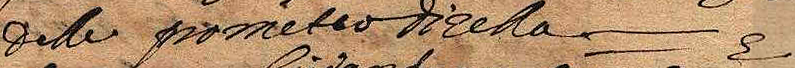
delle prometeo dizella E
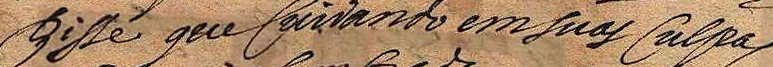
Disse que Cuidando em suas Culpas
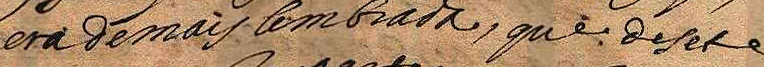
era demais lembrada, que de sete
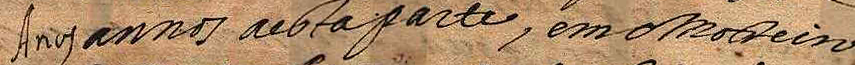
annos a esta parte, em o mosteiro
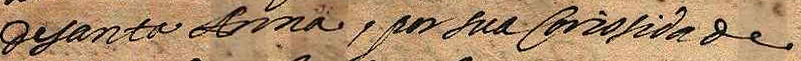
de santa Anna, por sua Coriosidade
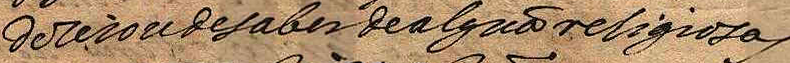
dezeiou de saber de algua̅ religiosas
